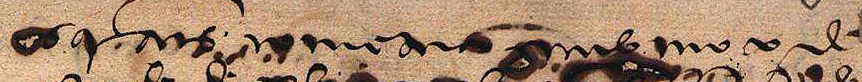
os quāes cometera sendo moço de
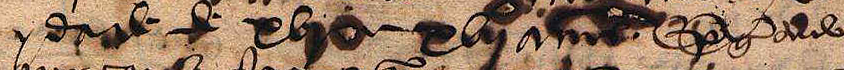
ydade de xbj ou xbij an̄os. E p̄gūtado
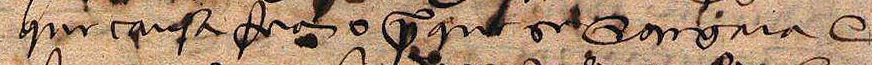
que causa fora o p̄o que se ētregara e
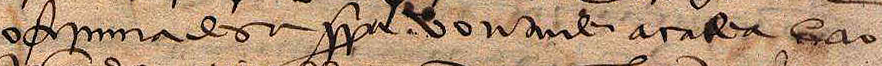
ofereecera de sa ꝓpia vontade a cadea e ao
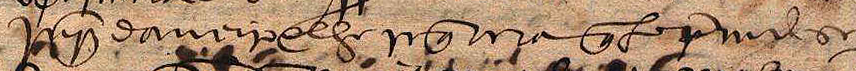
Juj̄z daueiro e lhe req̄rera q̄ ho p̄mdese
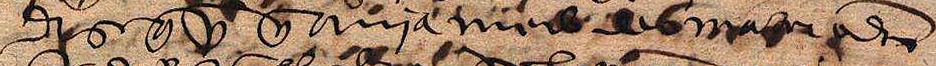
dise q̄ p̄o q̄ auja medo de o matar o d̄to
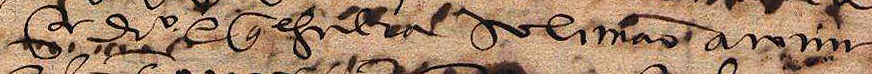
mte dio e q̄ lhe dera solimão a comer
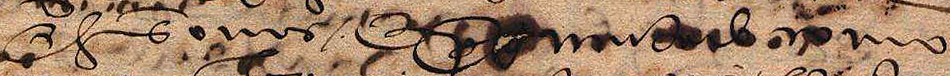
ē hūs ouos /. E p̄gumtado como
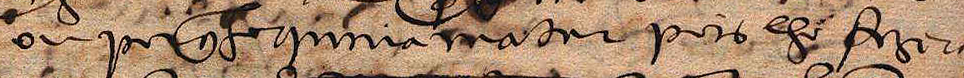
ou por q̄ ho queria matar pois lhe fezer
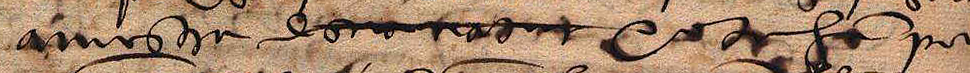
amostra de sua natur e o tinhā por
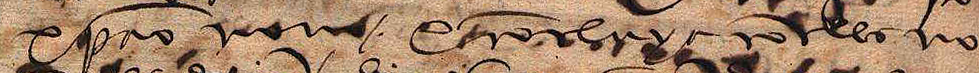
xpão nouo /. e cōcluya c̄o elles no
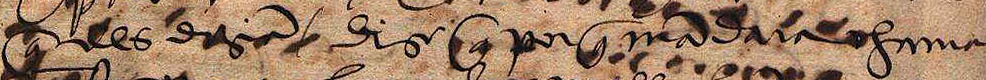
q̄ elles dizā / dise q̄ porq̄ mādara chama
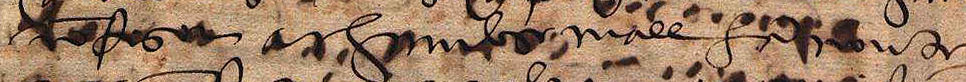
cōfesor achamdose mall huā noute
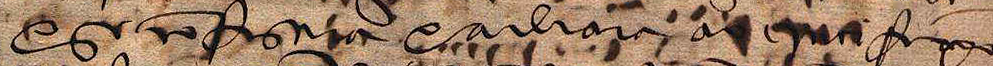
e se c̄ofesara e adorara ao crucifixo
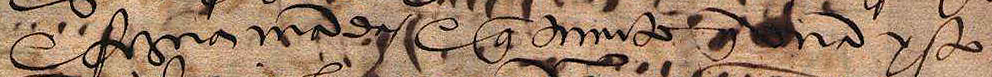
e fezera māda / e q̄ tamto q̄ virā ysto
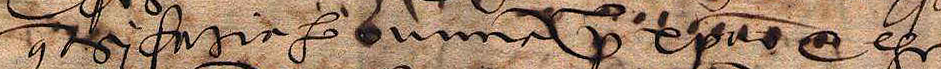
q̄ asy fazia ho ouuerā p̄o xpão e lhe
